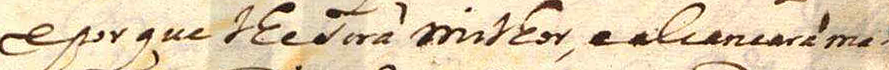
e porque lhe será milhor, e alcancarà ma
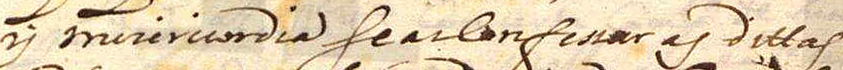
is meziricordia se as confessar as dittas
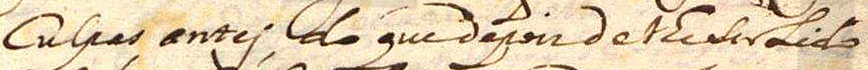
Culpas antes, do que depois de lhe ser Lido
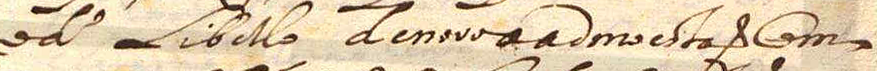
o do Libello, de novo a admoestaõ Com
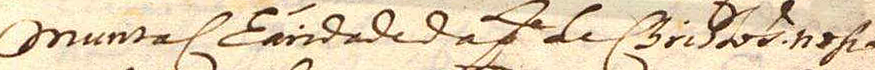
munta Charidade da pte de Chisto s.or nosso
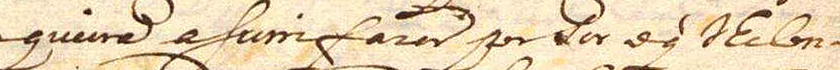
o queira assim fazer por ser o q̄ lhe con
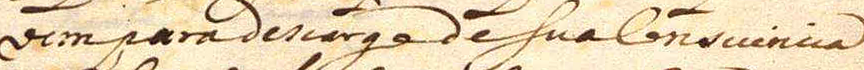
vem para descargo de sua Consciencia
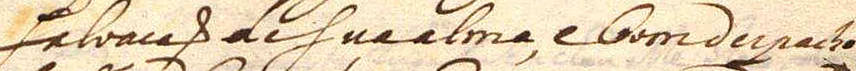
salvaçaõ de sua alma, e bom despacho
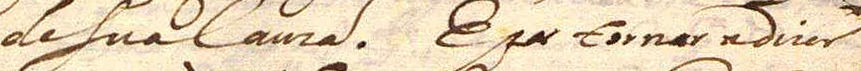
de sua Cauza. E por tornar a dizer
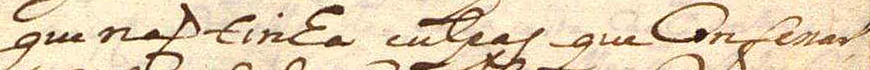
que naõ tinha culpas que Confessar
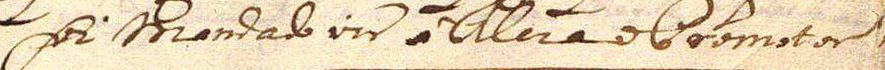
foi mandado vir a Meza o Promotor
